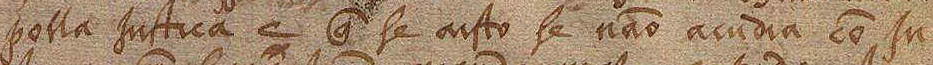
polla Justica e q̄ se a isto se não acudia cō Ju
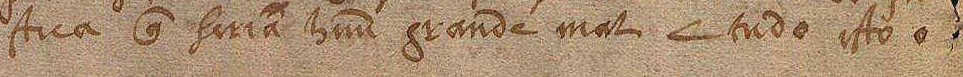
stica q̄ seria huū grande mal e tudo isto o
